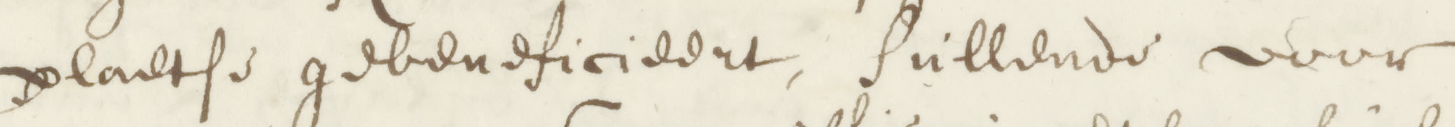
plaetse gebeneficieert, sullende voor
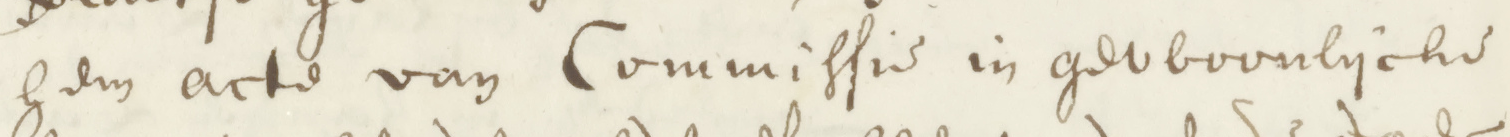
hem acte van Commissie in gewoonlijcke
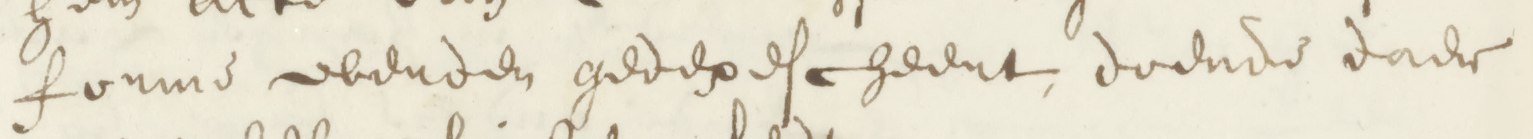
forme werden gedepescheert, doende daer
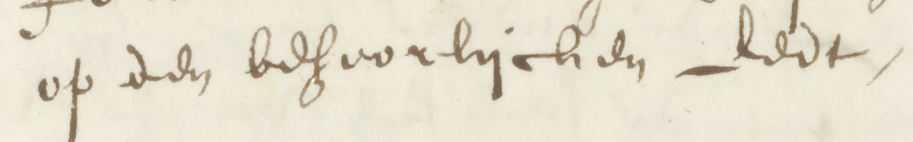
op den behoorlijcken Eedt.
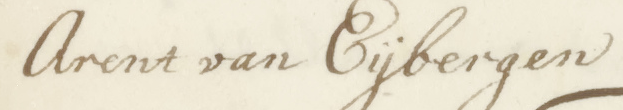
Arent van Eijbergen
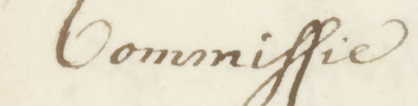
Commissie
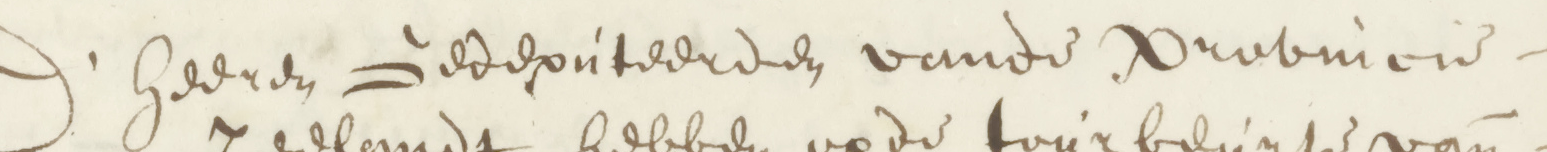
D‛heeren Gedeputeerden vande Provincie
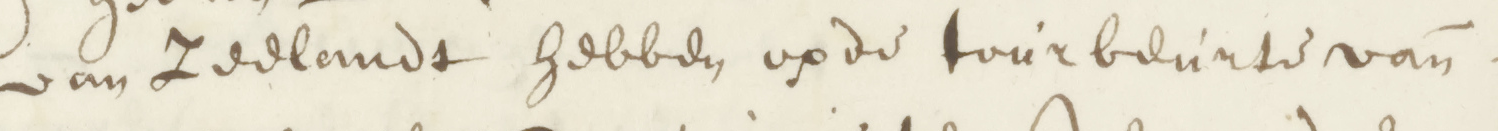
van Zeelandt hebben opde tourbeurte van
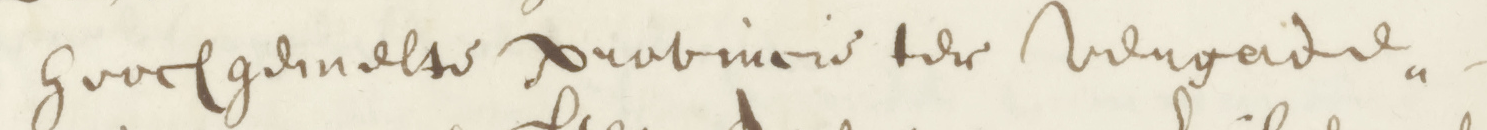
hoochgemelte Provincie ter Vergade„
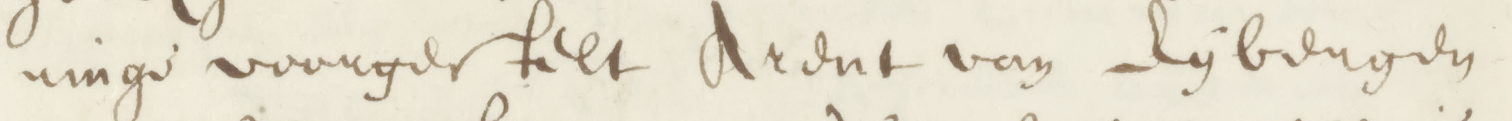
ringe voorgestelt Arent van Eijbergen
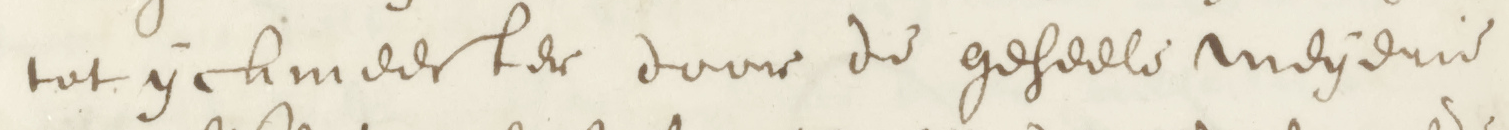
tot ijckmeester door de geheele Meijerie
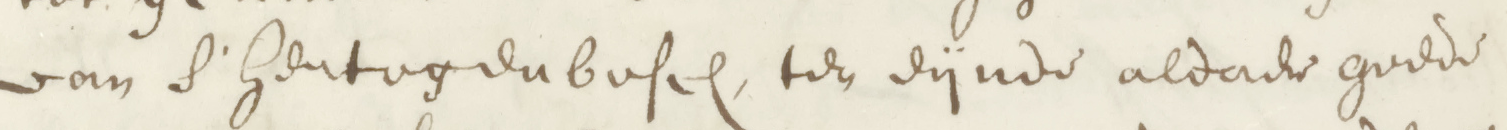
van s‛Hertogenbosch, ten eijnde aldaer goede
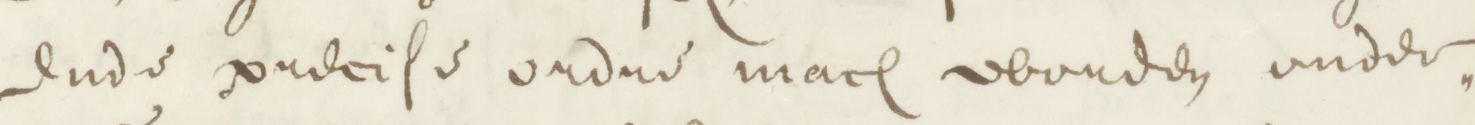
ende precise ordre mach worden onder„
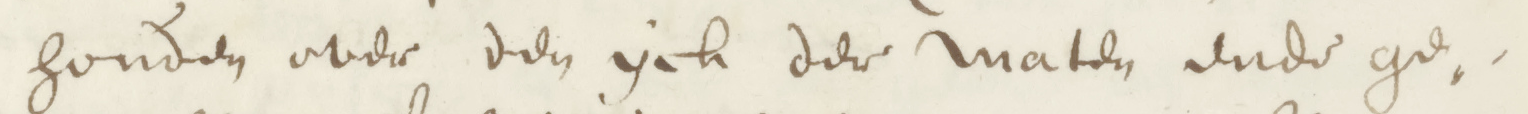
houden over den ijck der Maten ende ge„
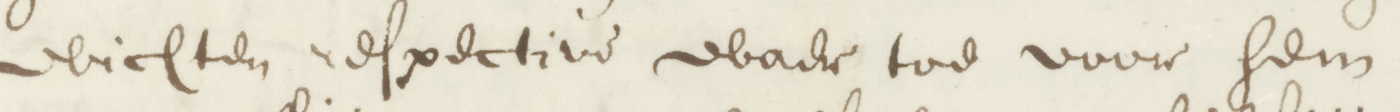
wichten respective waer toe voor hem
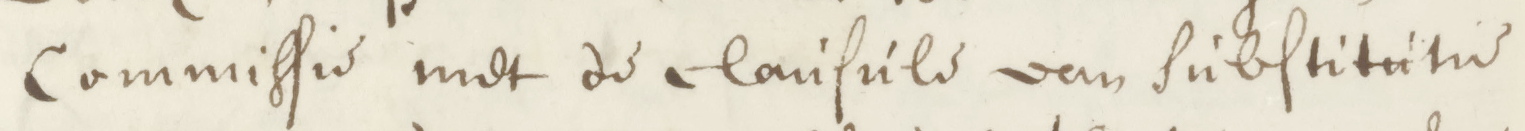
Commissie met de clausule van substitutie
